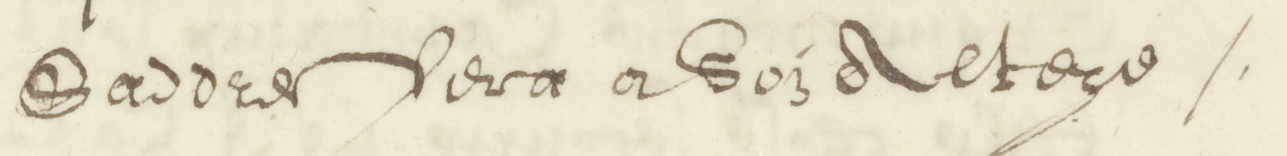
S'addressera a Son Alteze.
